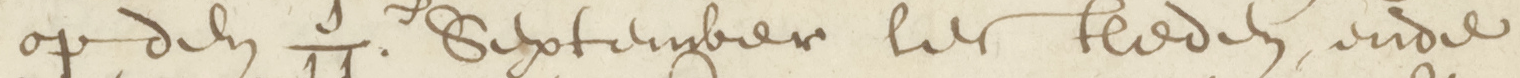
op den 11e September lestleden, ende
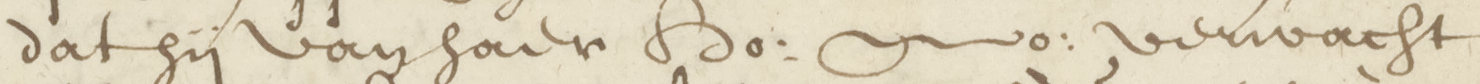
dat hij van haer Ho:Mo: verwacht
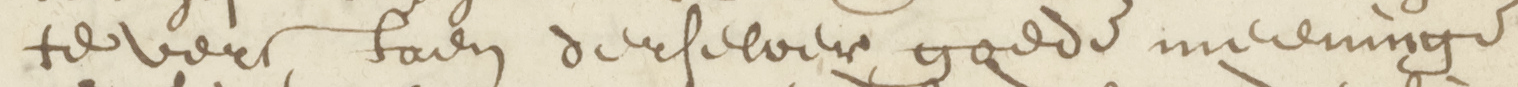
te verstaen derselver goede meeninge
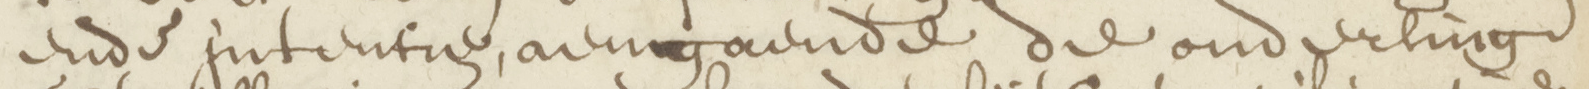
ende intentie, aengaende de onderlinge
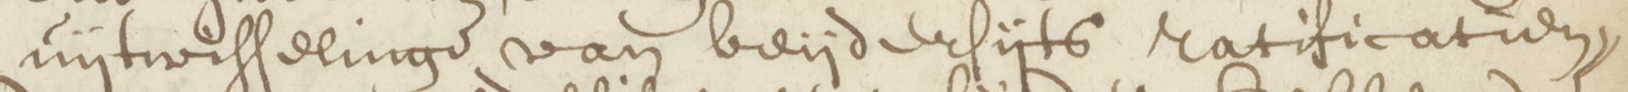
uijtwisselinge van beijdersijts ratificatien.
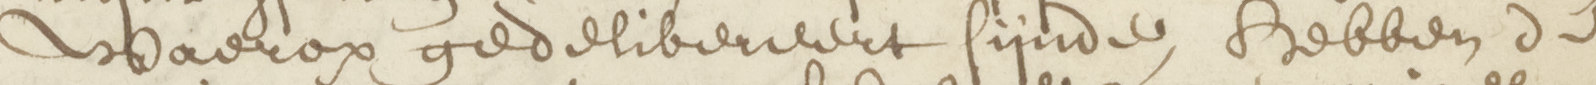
Waerop gedelibereert sijnde, hebben de
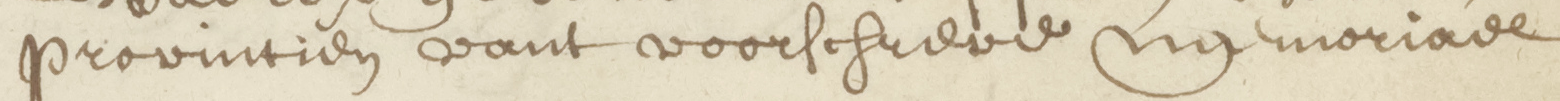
provintien vant voorschreve memoriael
